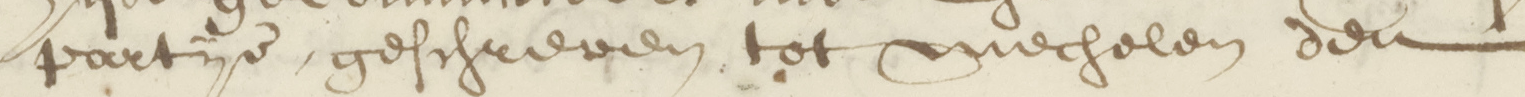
partije, geschreven tot Mechelen den
